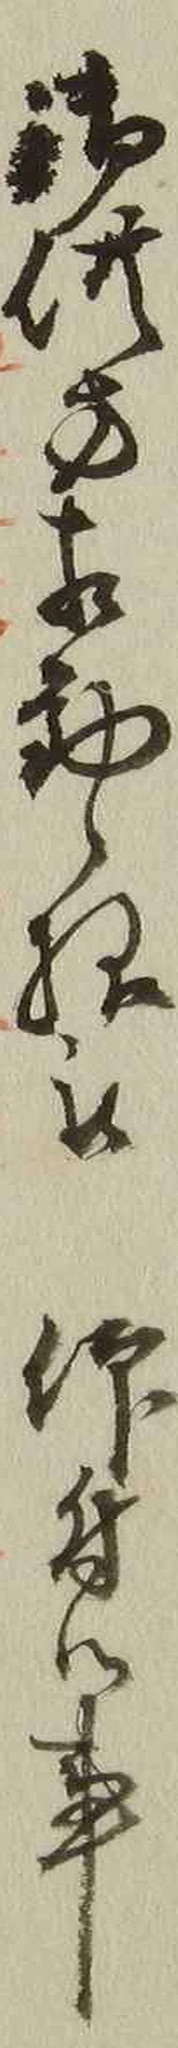御供方相勤候様被仰付候事
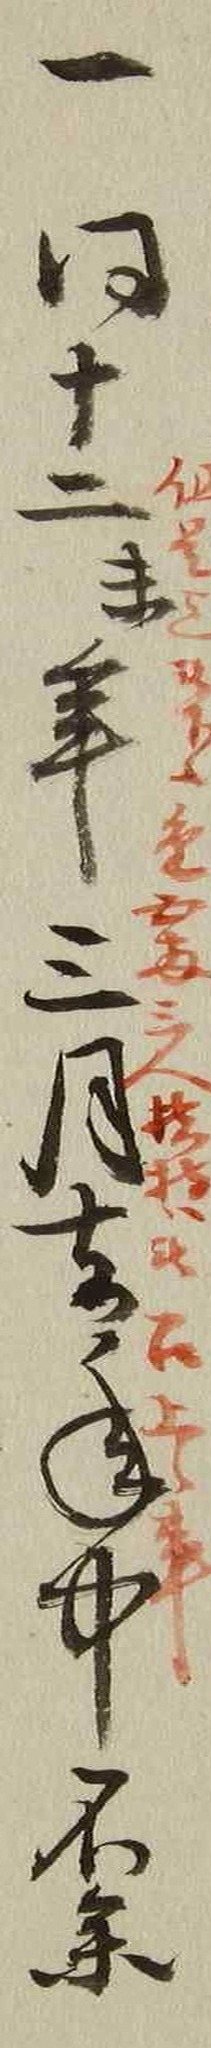一同十二未年三月去年中不参
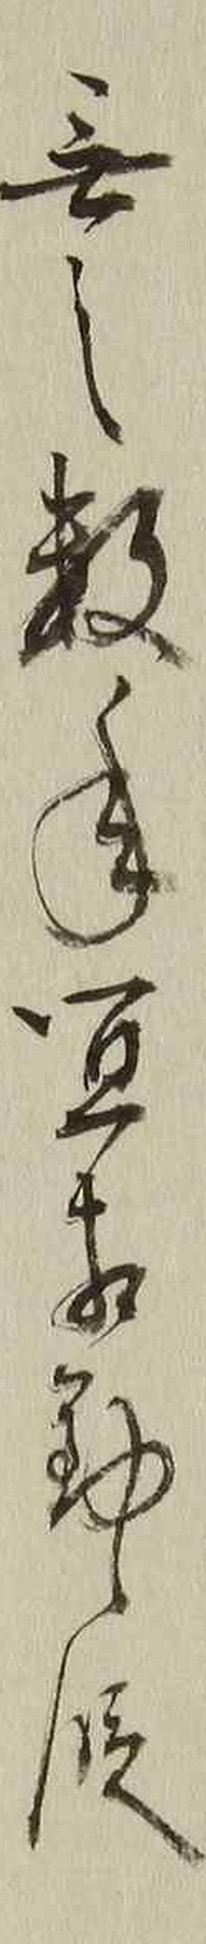無之数年宜相勤候段
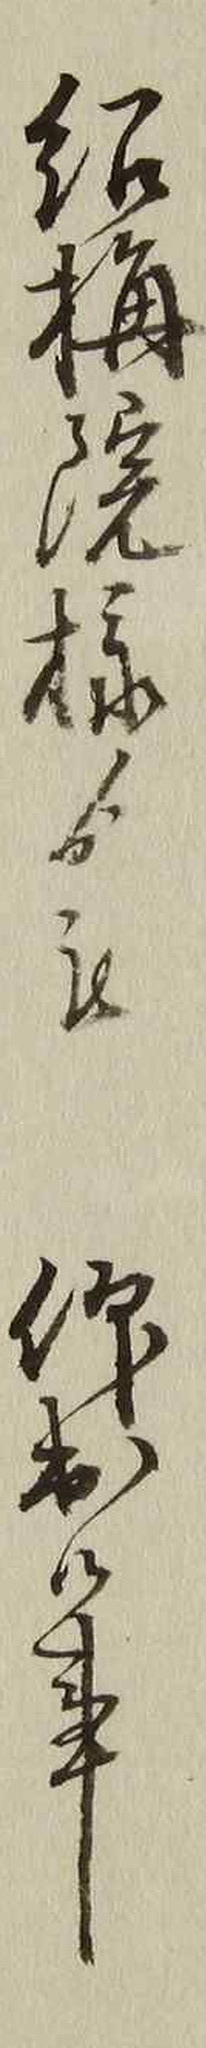紹栴院様ゟ被仰出候事
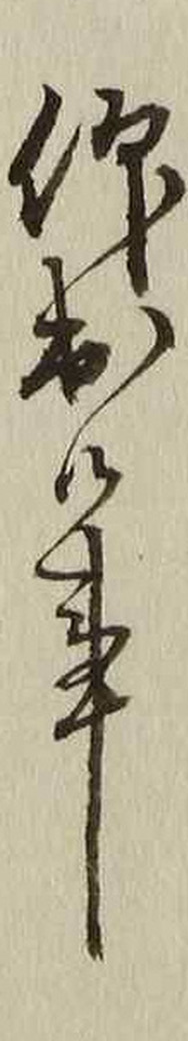仰出候事
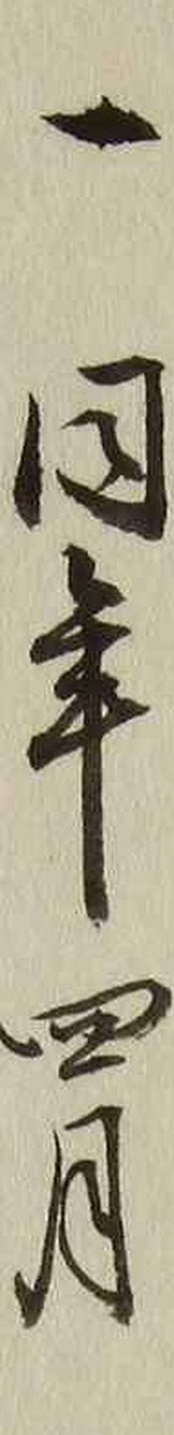一同年四月
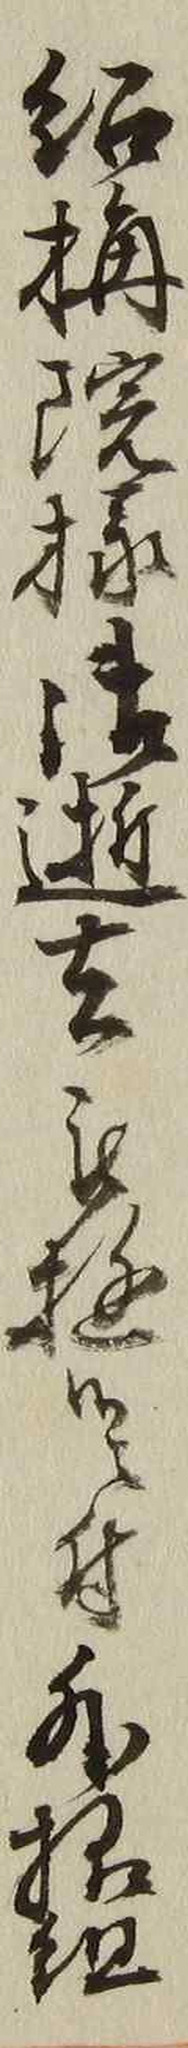紹栴院様御遊去被遊候ニ付外様組
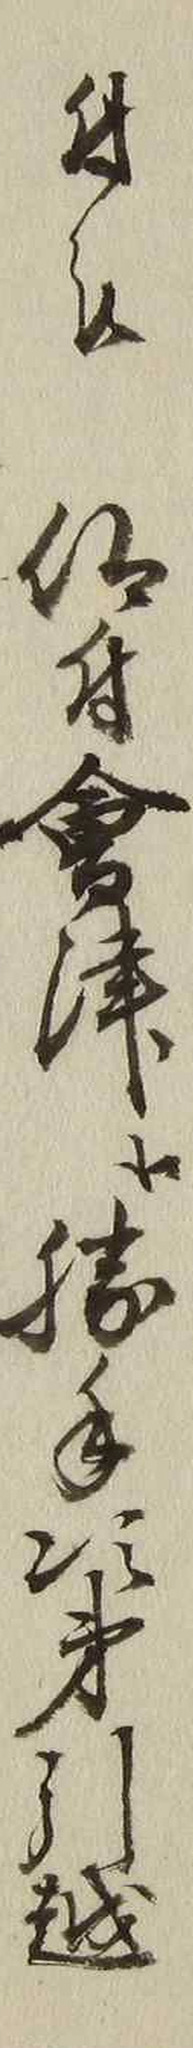付被仰付会津江勝手次第引越
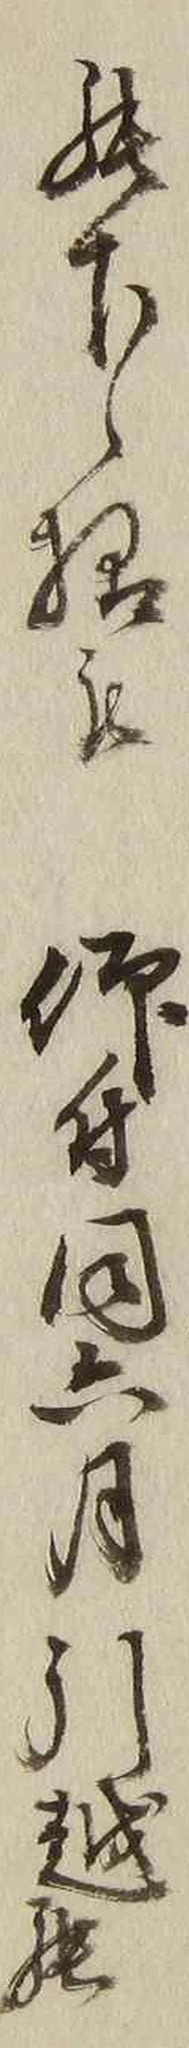罷下候様被仰付同六月引越罷
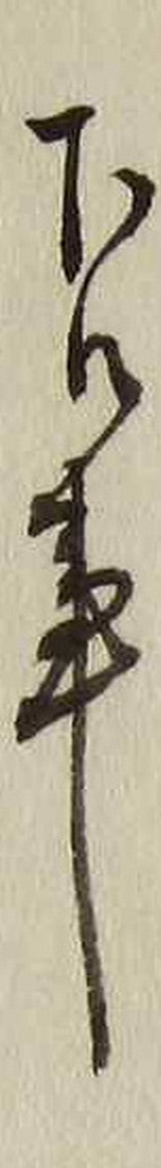下候事
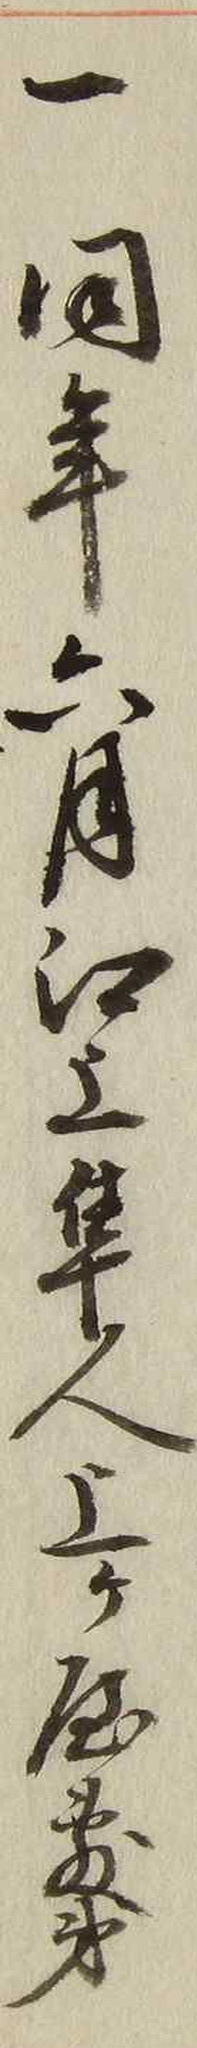一同年六月江上隼人上ケ屋敷弟
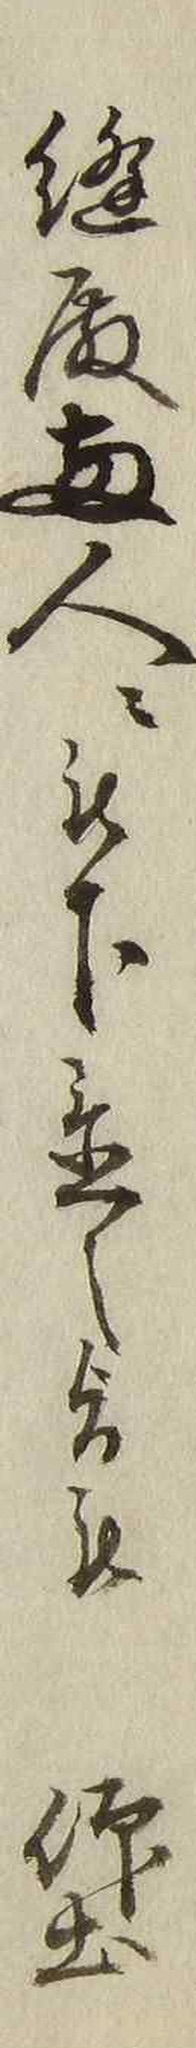縫殿両人ニ被下置之旨被仰出
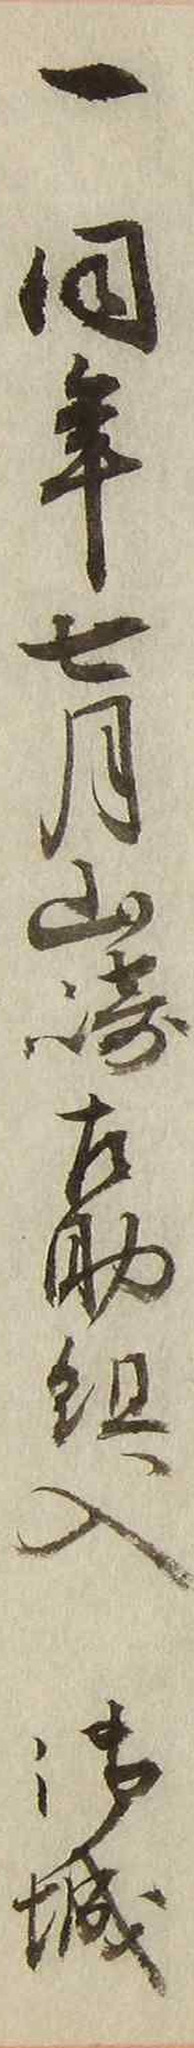一同年七月山崎左助組へ入御城

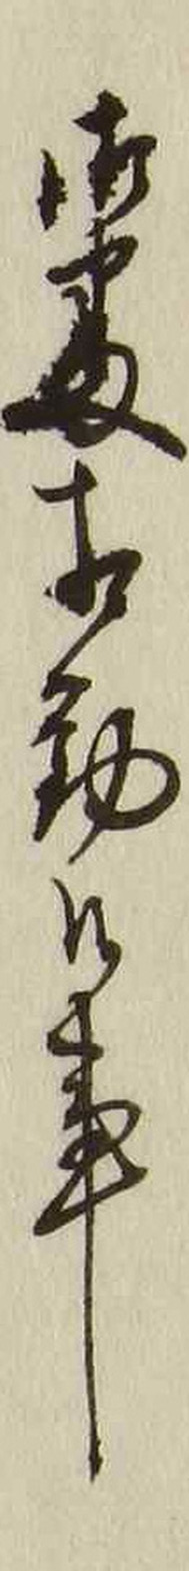御番相勤候事
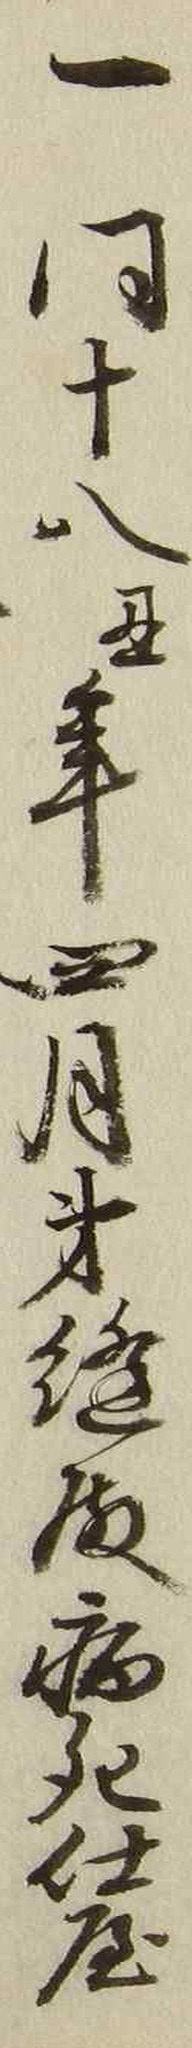一同十八丑年四月弟縫殿病死仕屋
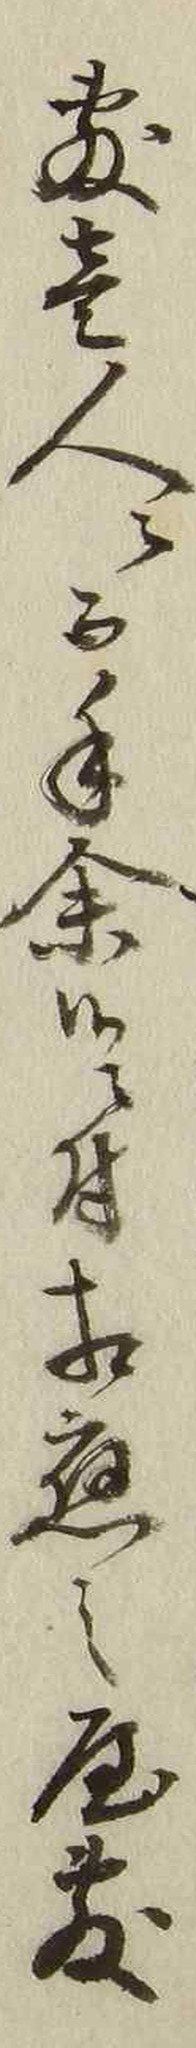敷壱人ニ而手余候ニ付相応之屋敷
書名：諸士系譜　巻之23　い之部23
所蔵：会津若松市立会津図書館
